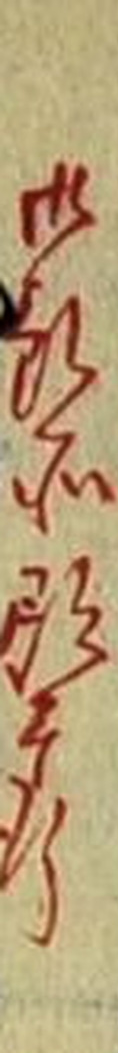御預所郡奉行
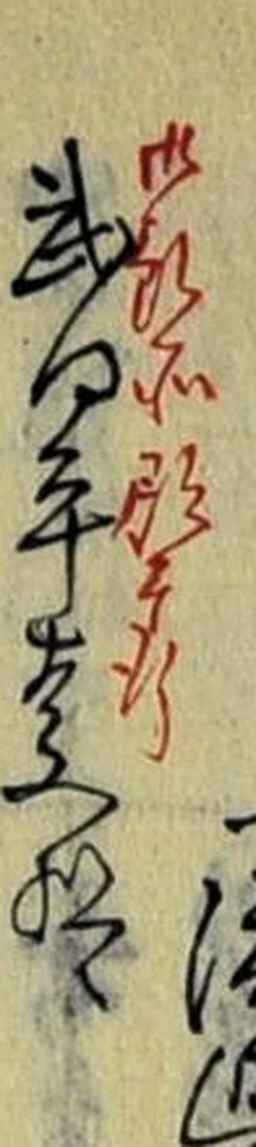武田平太夫組へ
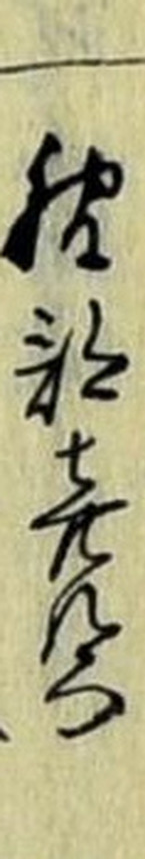服部喜左衛門
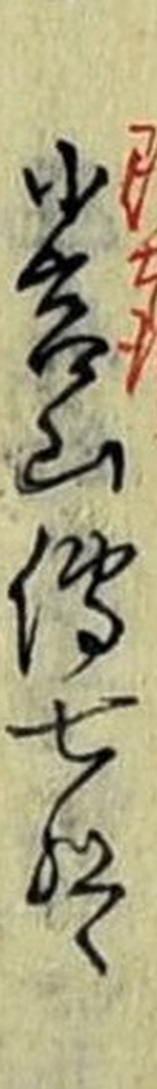小宮山伝七組へ
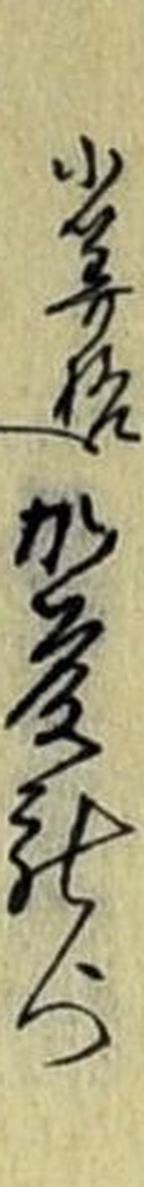小算格加藤文右衛門
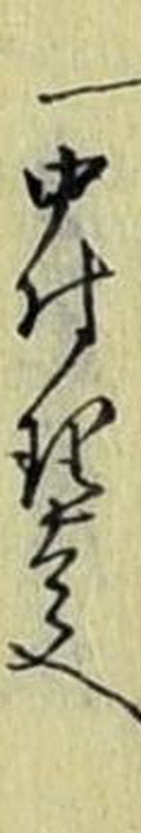中村理太夫
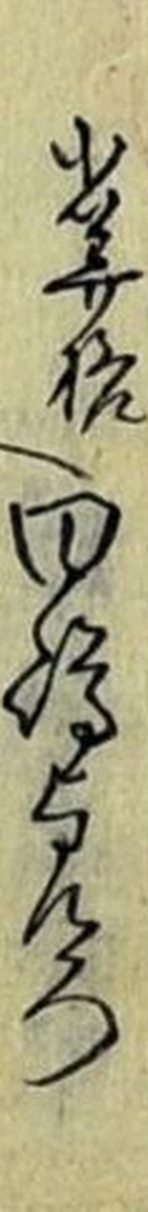小算格山形五左衛門
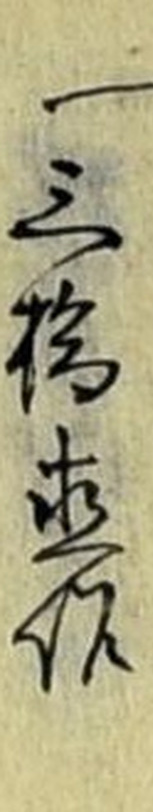三橋直作
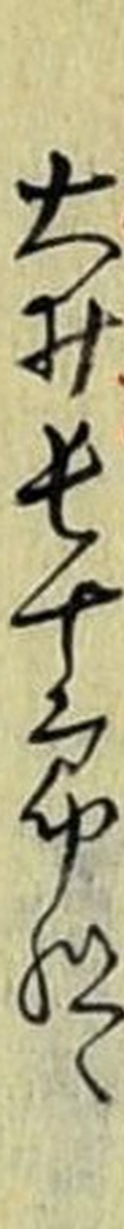大井長十郎組へ
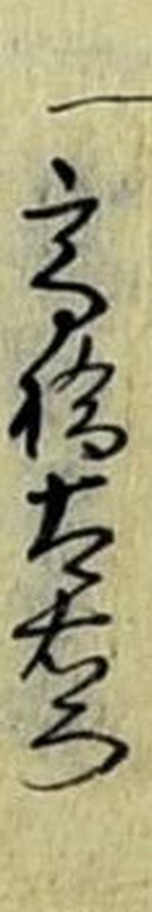高橋直右衛門
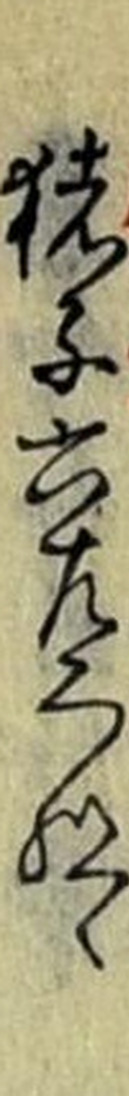猪子六左衛門組へ
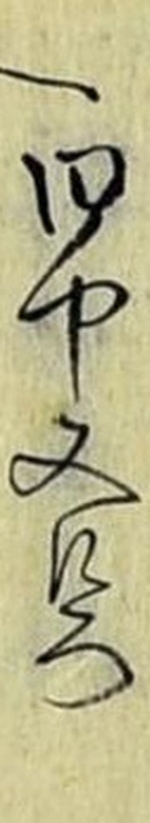田中又左衛門
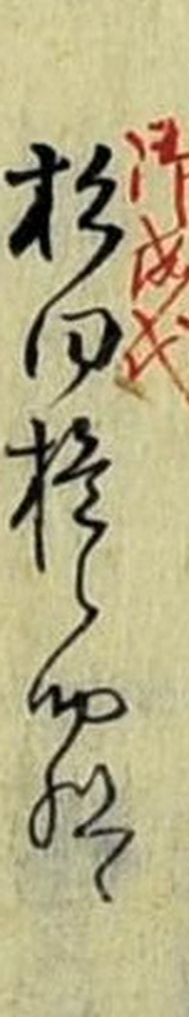杉田権之助組へ
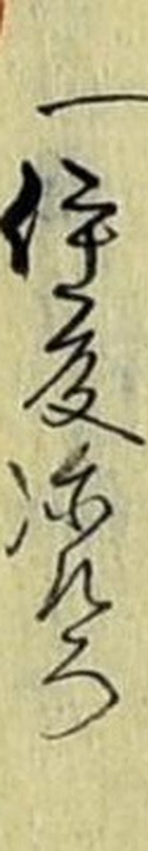伊藤弥左衛門
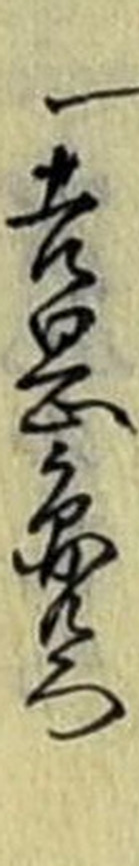吉岡円左衛門
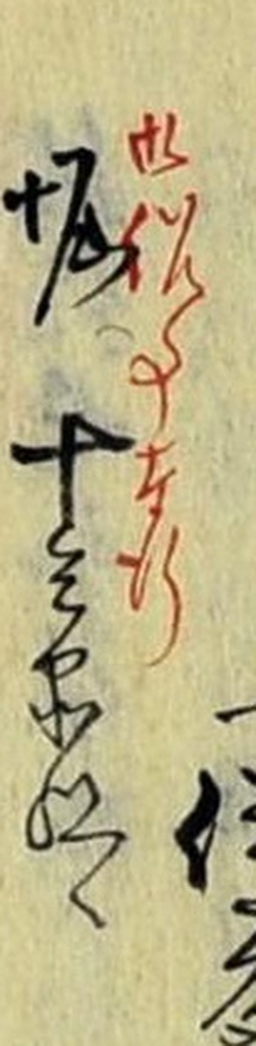堀十兵衛組へ
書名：命令之部 四
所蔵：福井県文書館 Fukui Prefectural Archives
